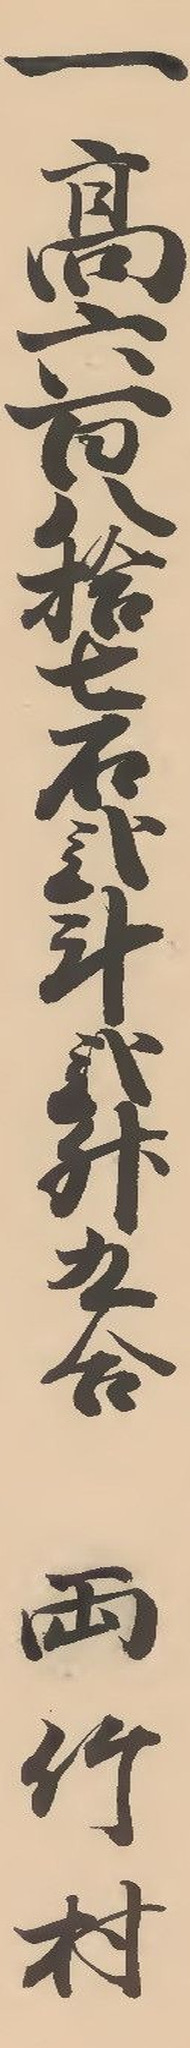一高六百八拾七石弐斗弐升九合両竹村
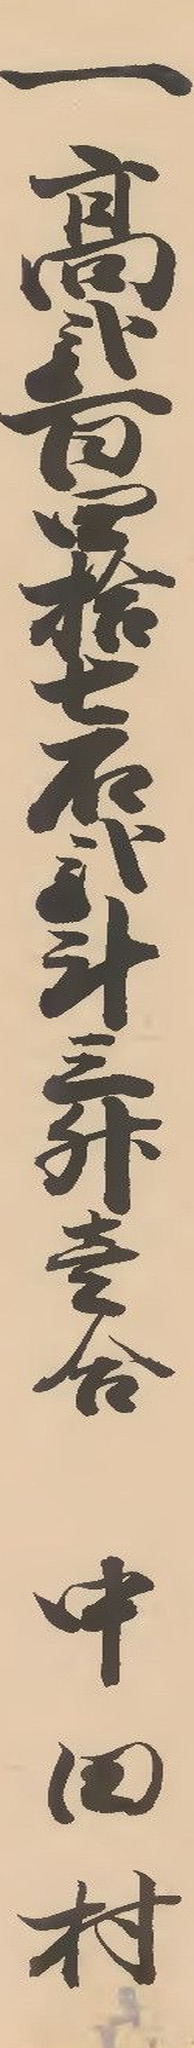一高弐百四拾七石弐斗三升壱合中田村
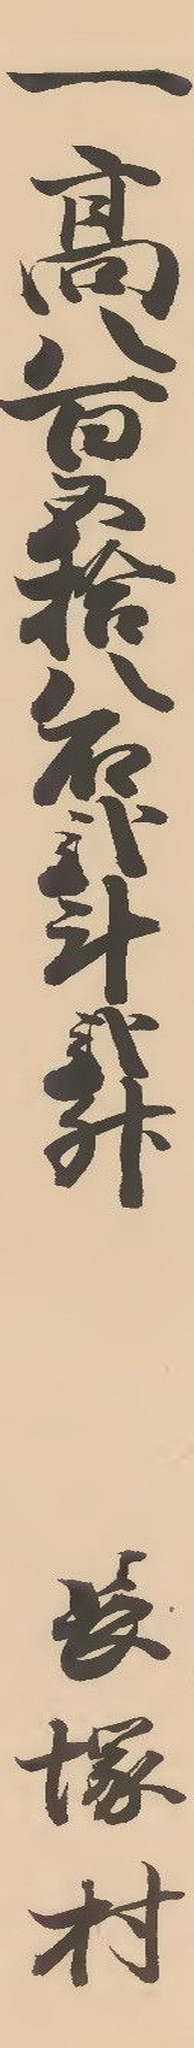一高八百五拾八石弐斗弐升長塚村
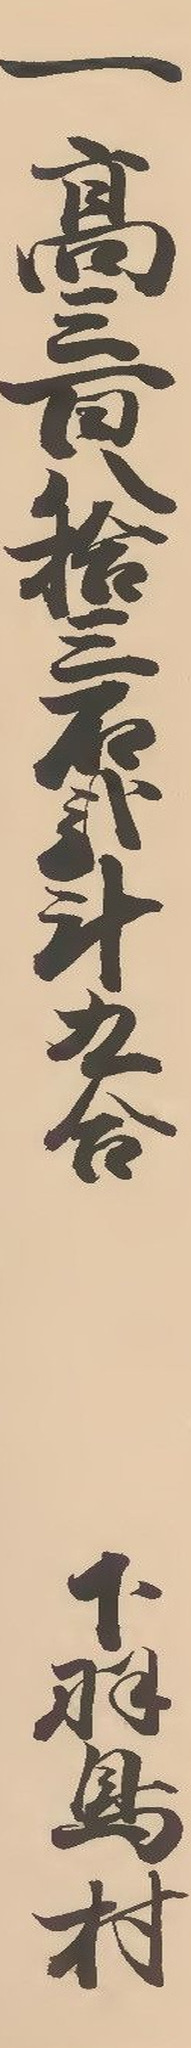一高三百八拾三石弐斗九合下羽鳥村
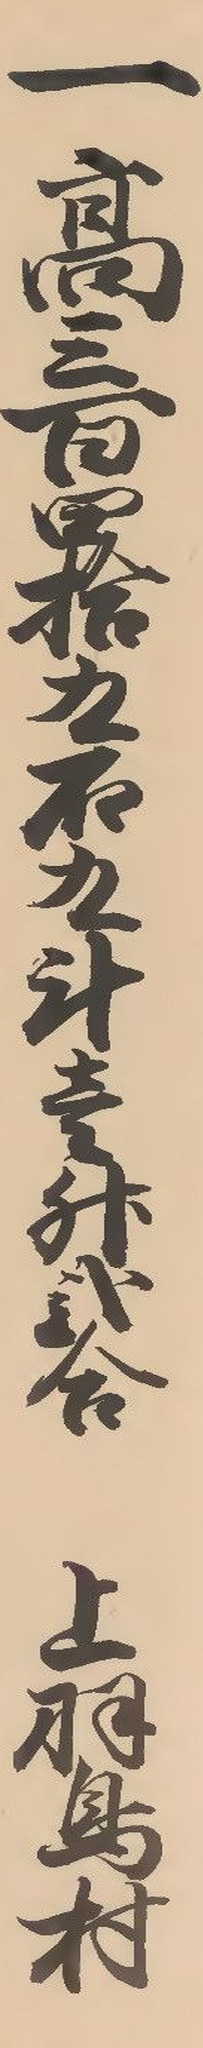一高三百四拾九石九斗壱升弐合上羽鳥村
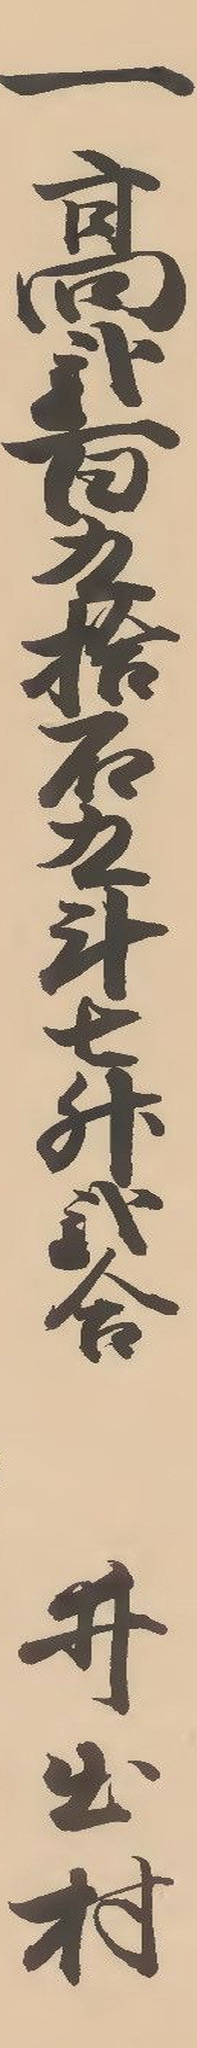一高弐百九拾石九斗七升弐合井出村
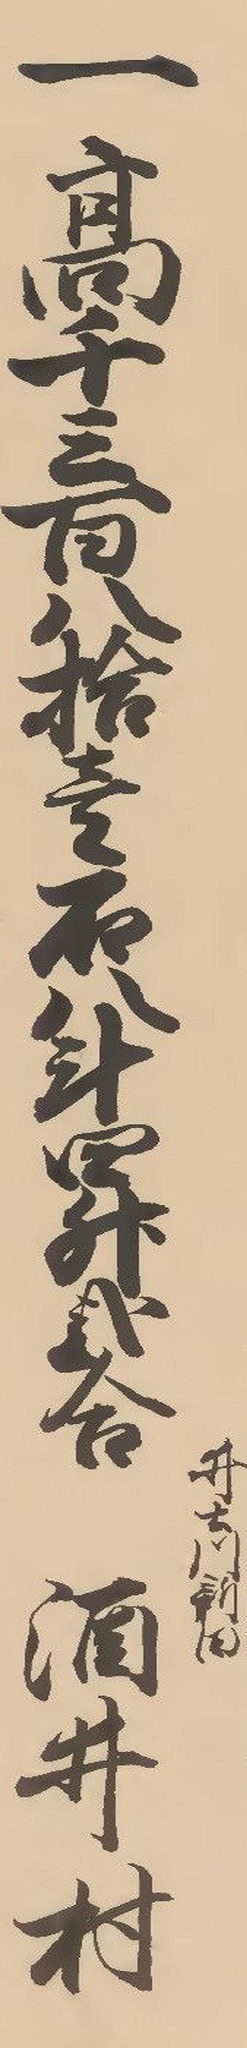一高千三百八拾壱石八斗四升弐合酒井村
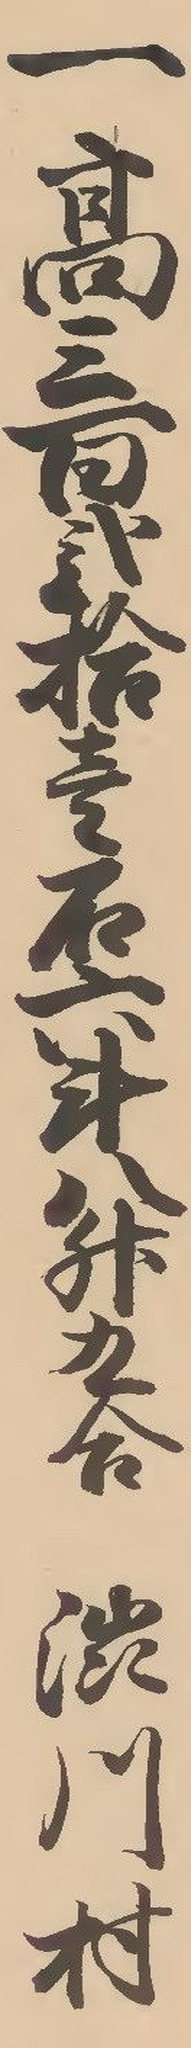一高三百弐拾壱石六斗八升九合渋川村

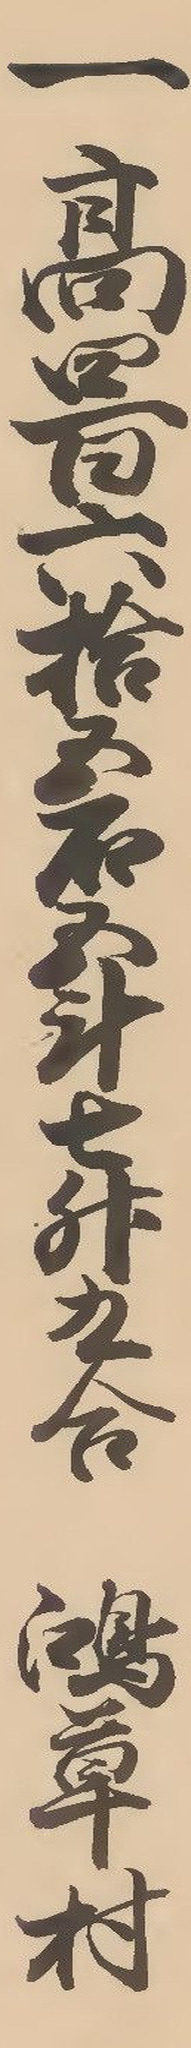一高四百六拾五石五斗七升九合鴻草村
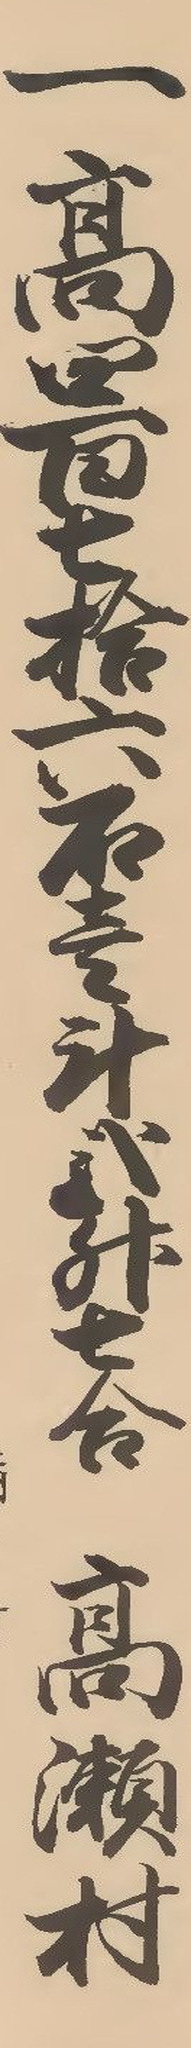一高四百七拾六石壱斗弐升七合高瀬村
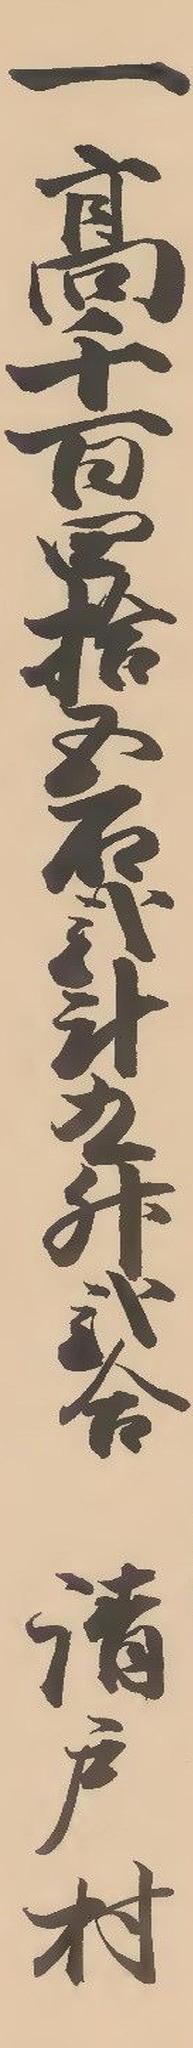一高千百四拾五石弐斗九升弐合請戸村
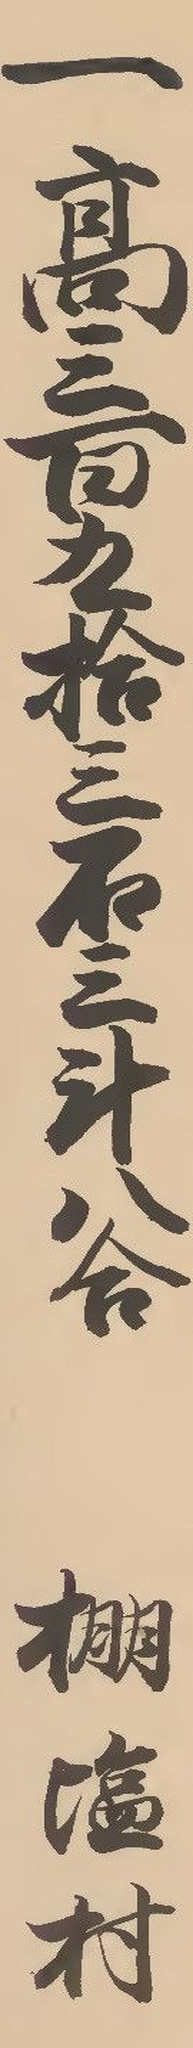一高三百九拾三石三斗八合棚塩村
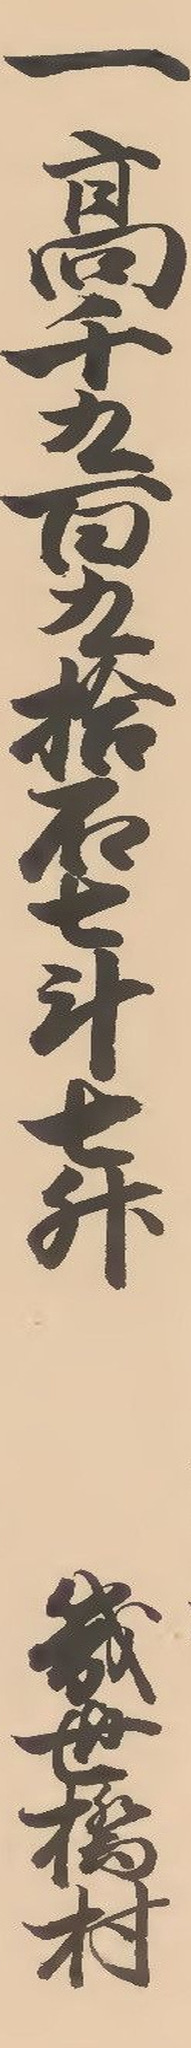一高千九百九拾石七斗七升幾世橋村
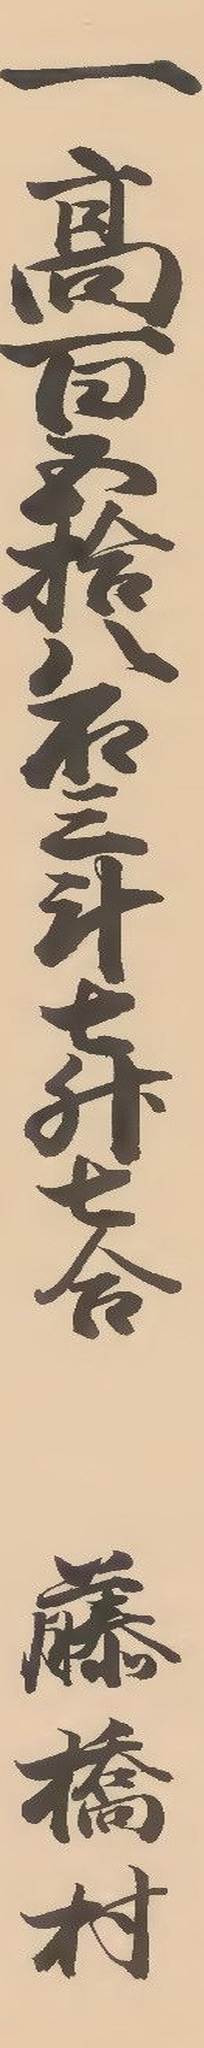一高百五拾八石三斗七升七合藤橋村
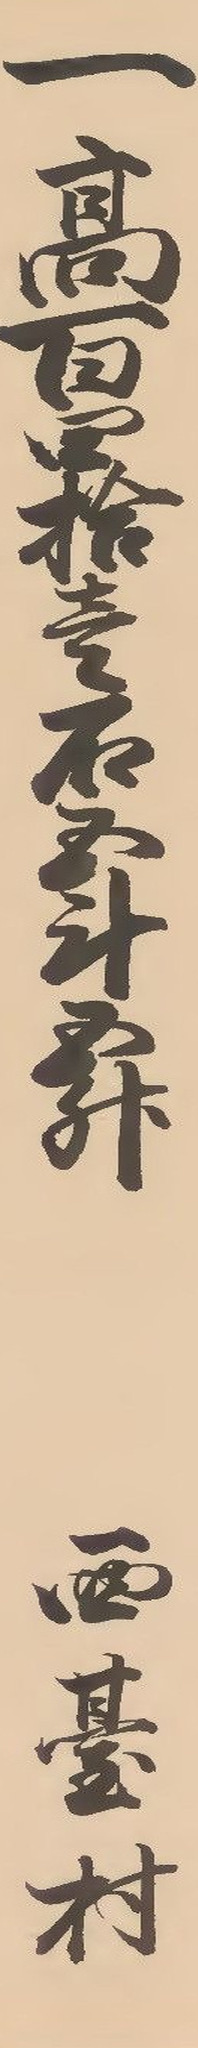一高百四拾壱石五斗五升西台村
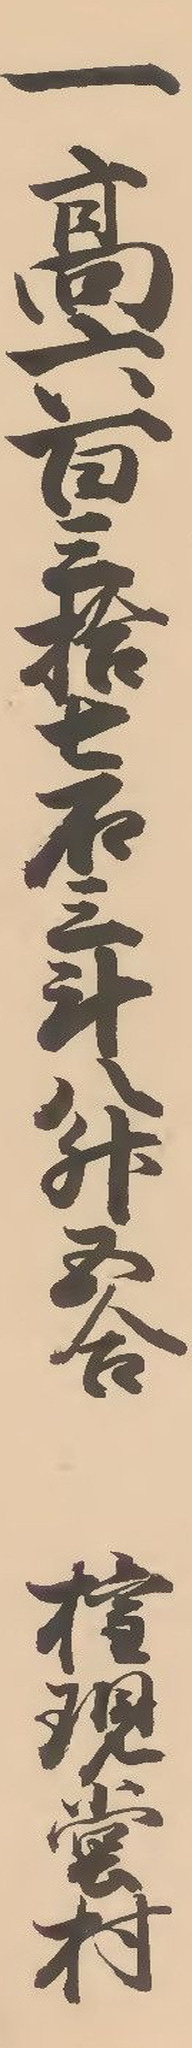一高六百三拾七石三斗八升五合権現堂村
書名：陸奥国郷帳　３
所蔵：国立公文書館 National Archives of Japan
